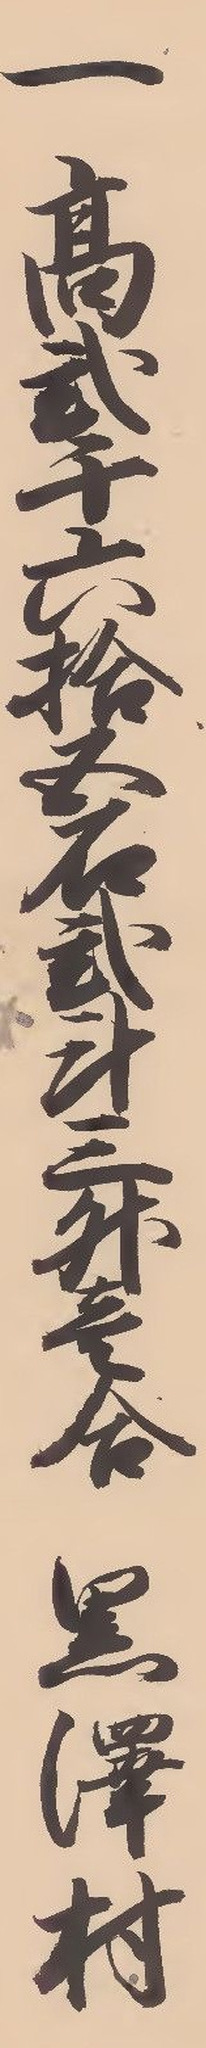一高弐千六拾五石弐斗三升壱合黒沢村

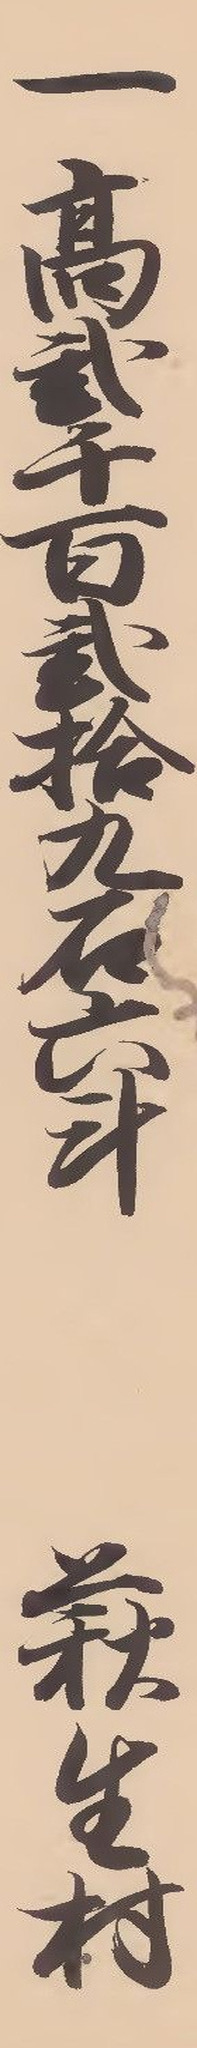一高弐千百弐拾九石六斗萩生村
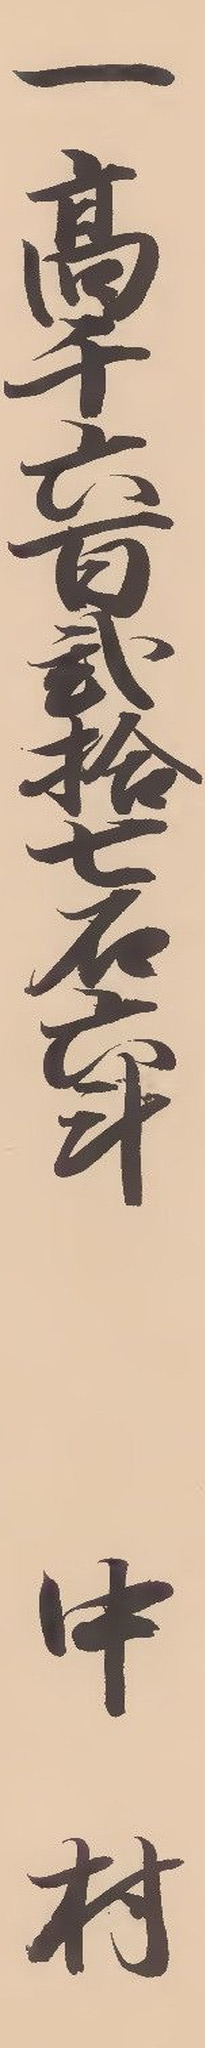一高千六百弐拾七石六斗中村
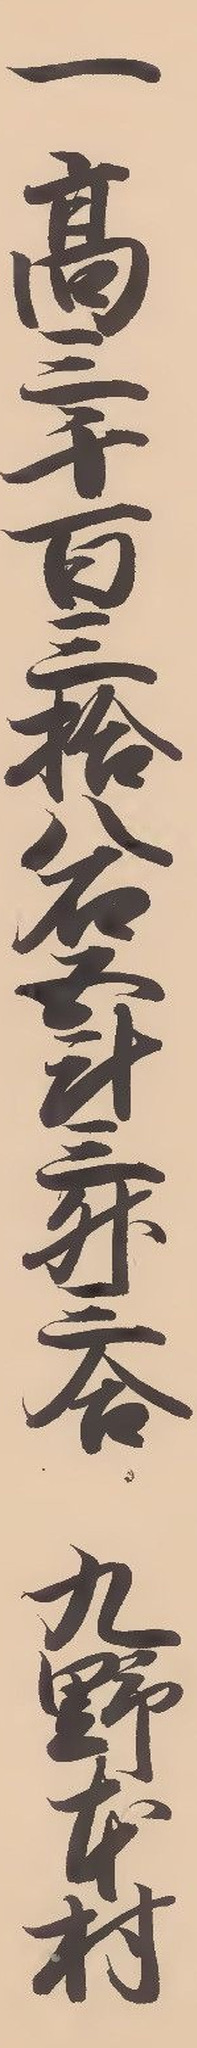一高三千百三拾八石五斗三升三合九野本村
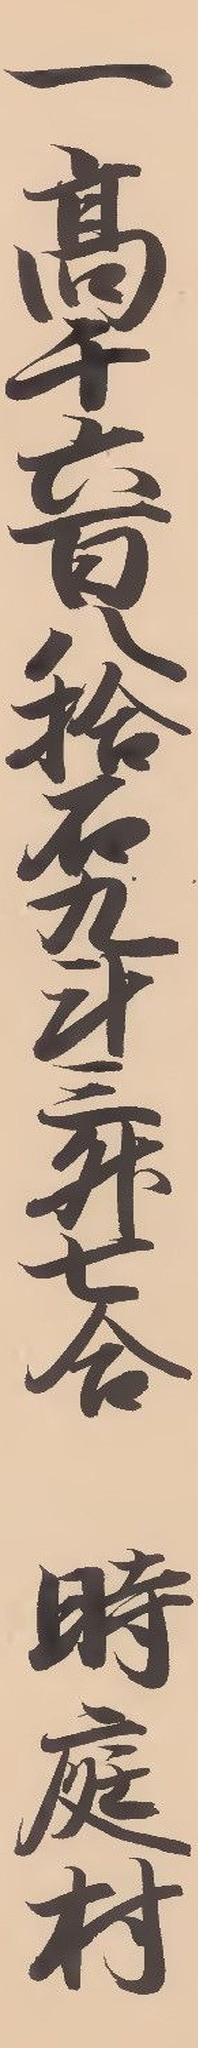一高千六百八拾石九斗三升七合時庭村
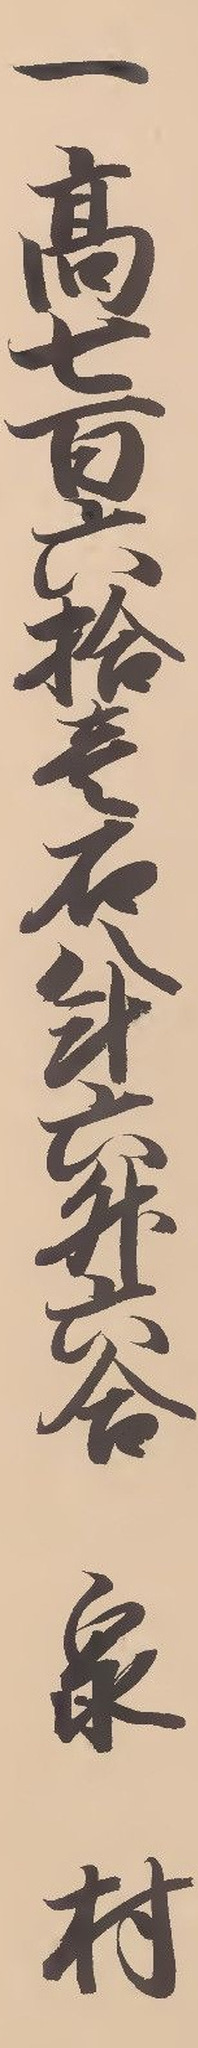一高七百六拾壱石八斗六升六合泉村
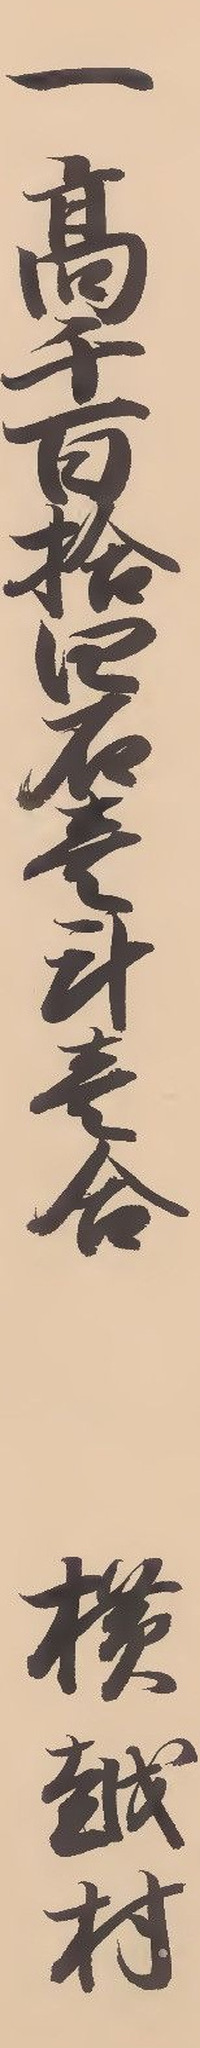一高千百拾四石壱斗壱合横越村
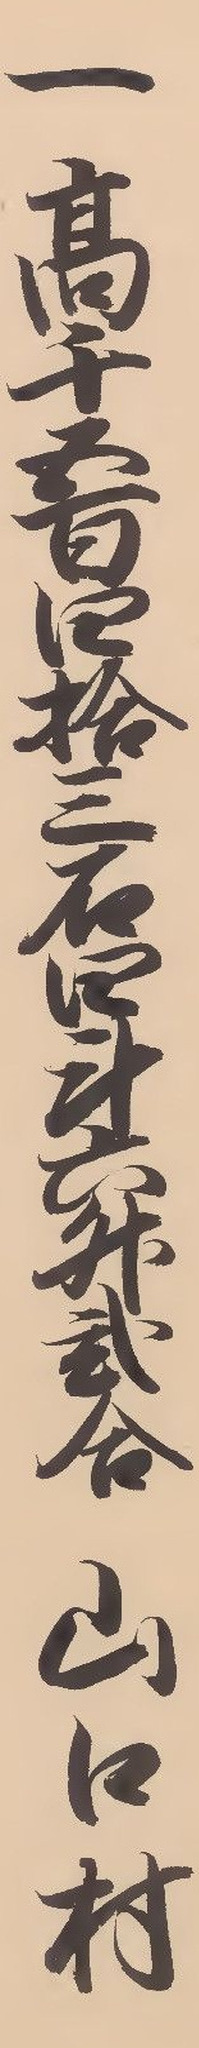一高千五百四拾三石四斗六升弐合山口村
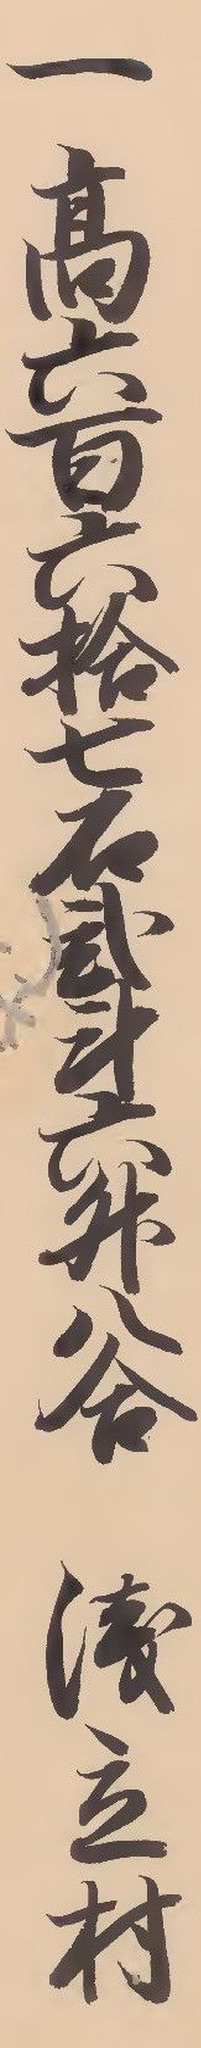一高六百六拾七石弐斗六升八合浅立村

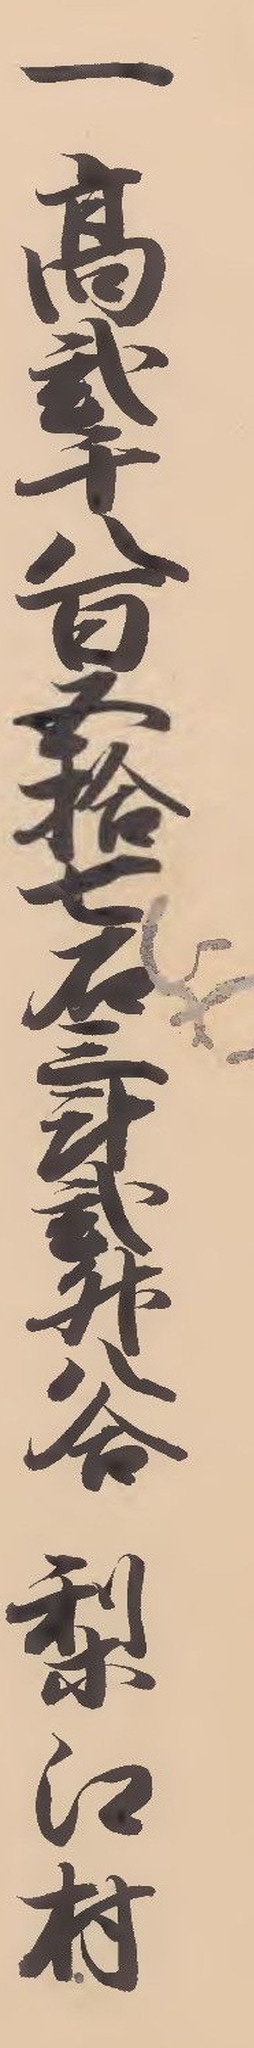一高弐千八百五拾七石三斗弐升八合梨口村
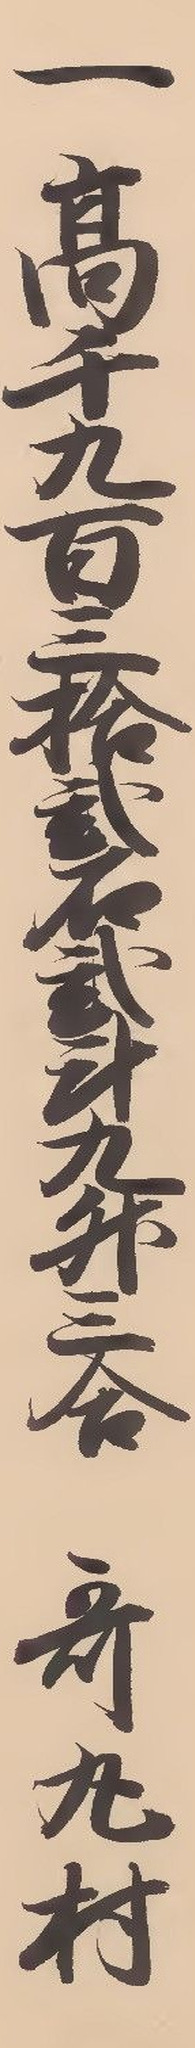一高千九百三拾弐石弐斗九升三合歌丸村
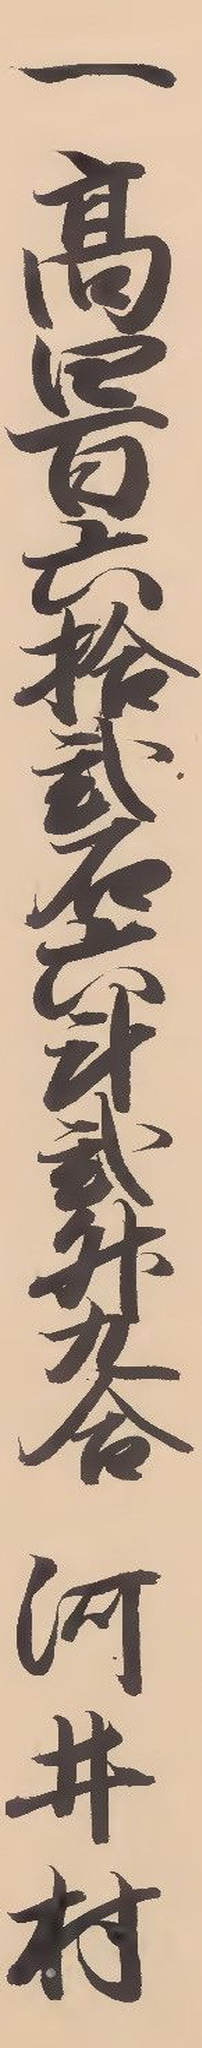一高四百六拾弐石六斗弐升九合河井村
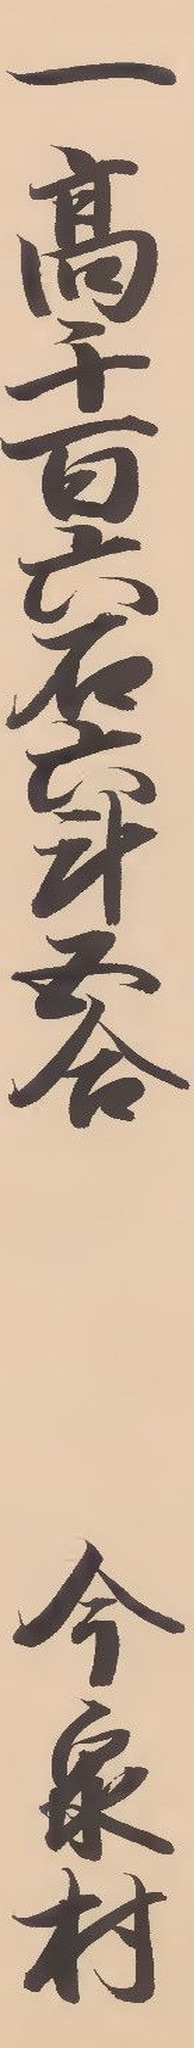一高千百六石六斗五合今泉村
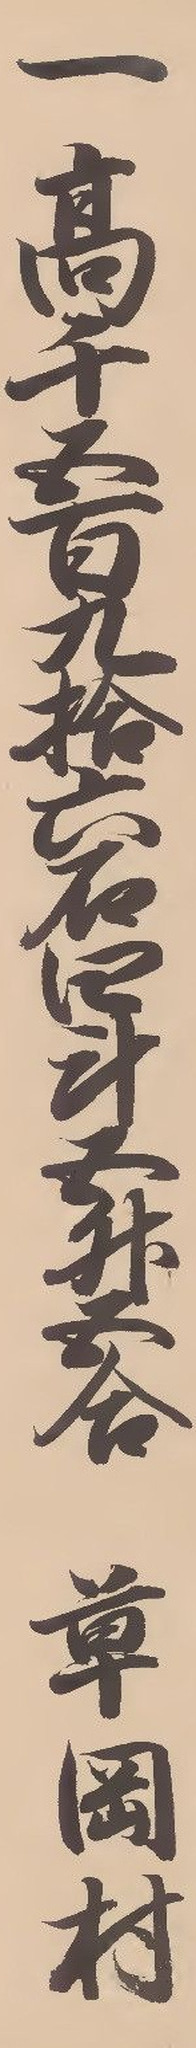一高千五百九拾六石四斗五升五合草岡村
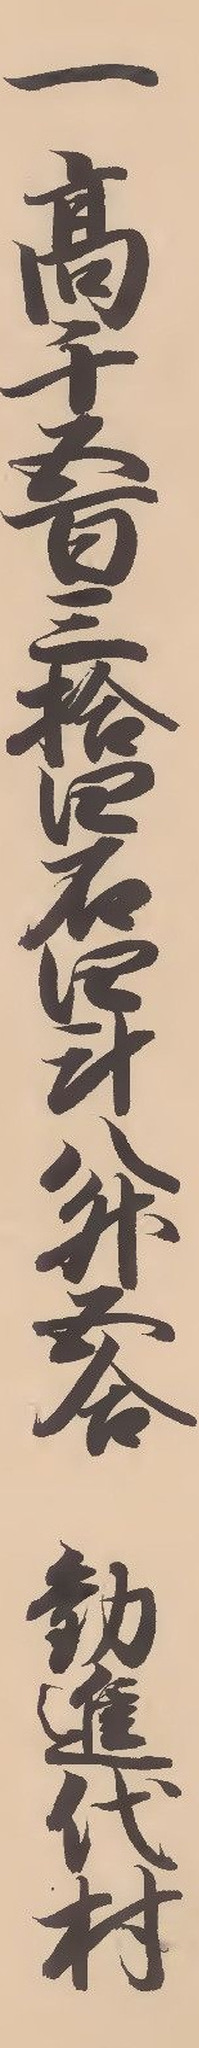一高千五百三拾四石四斗八升五合勧進代村
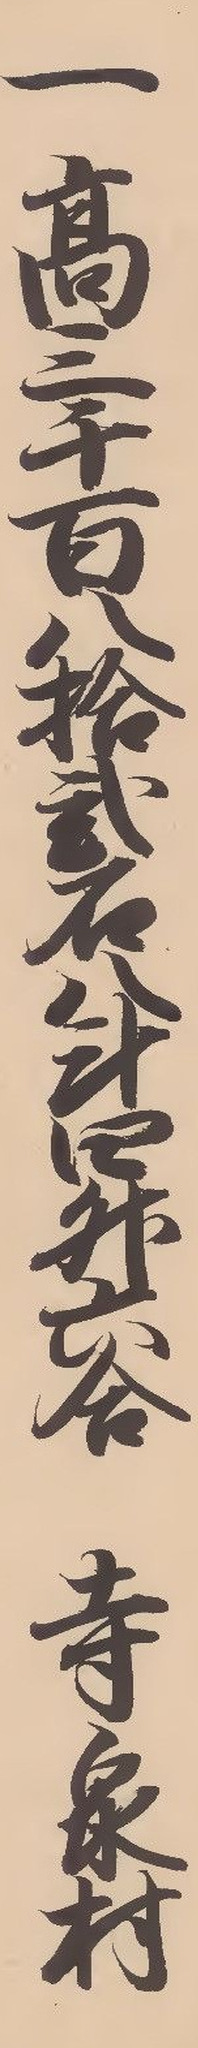一高三千百八拾弐石八斗四升六合寺泉村
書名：出羽国郷帳　１
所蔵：国立公文書館 National Archives of Japan
